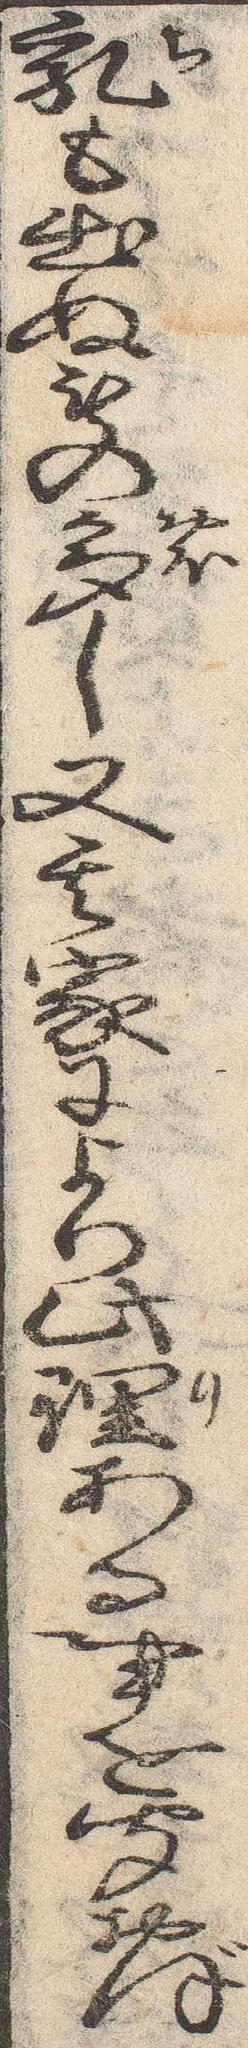乳も出ぬもの多し又其家により此理ある事を聞おぼ

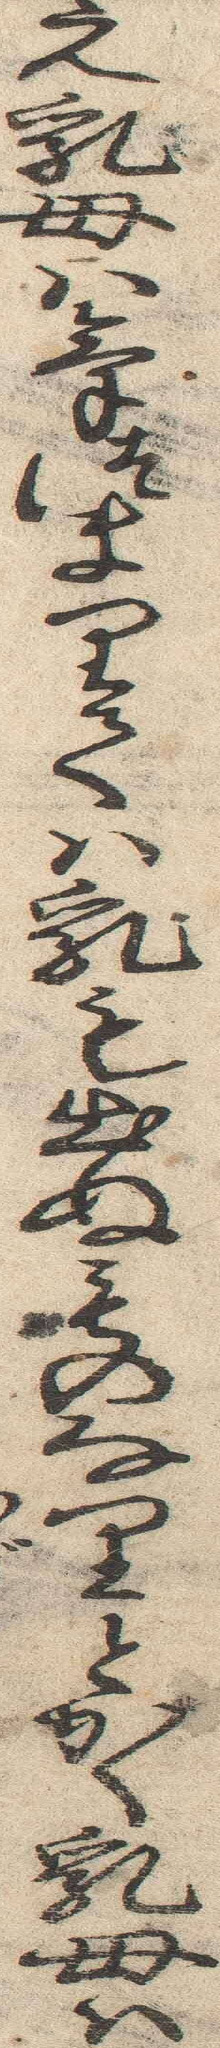え乳母は気つまりては乳も出ぬものなりとかく乳母は
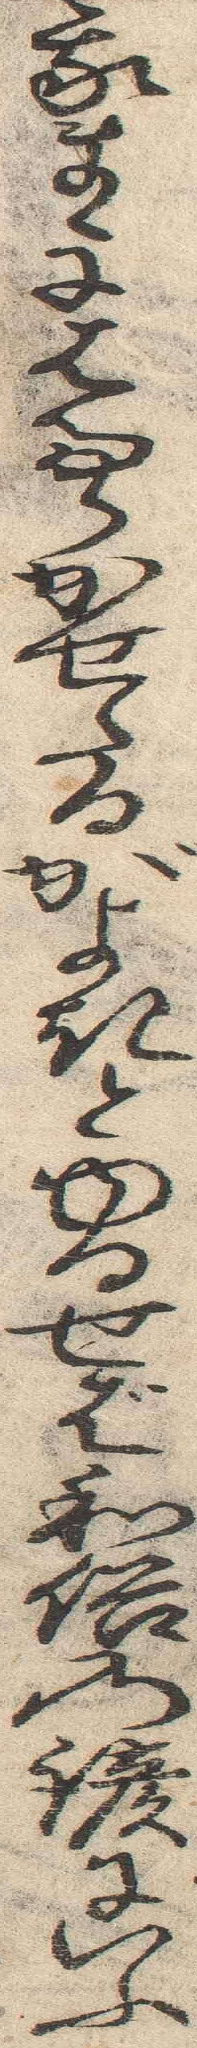我まゝにはたらかせたるがよきとゆるせば和俗の諺にいふ
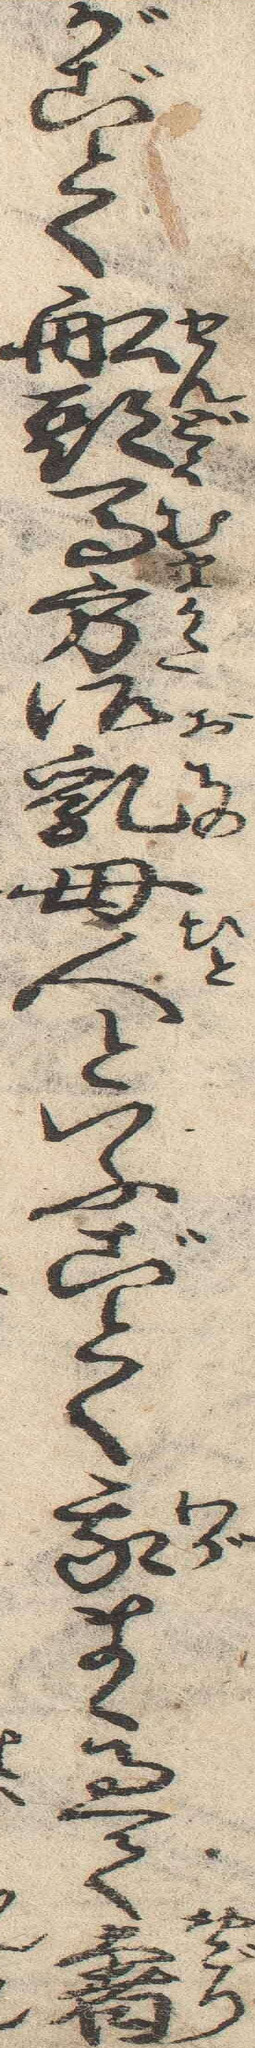がごとく舩頭馬方御乳母人といふごとく我まゝ過て奢
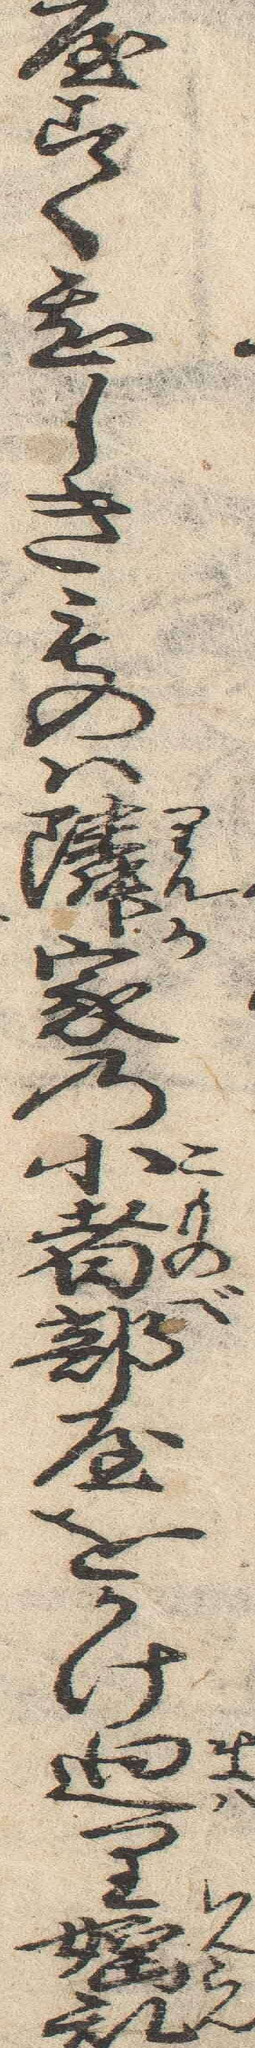やすく甚しきものは隣家の小者部屋をかけ廻り婬乱
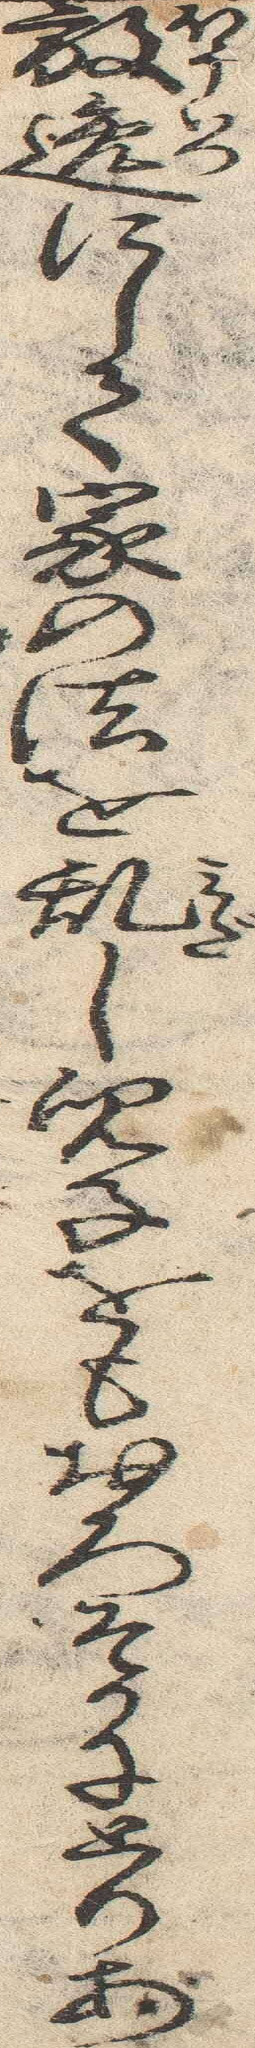放逸にして家の法を乱し児子をもおろそかにとりあ
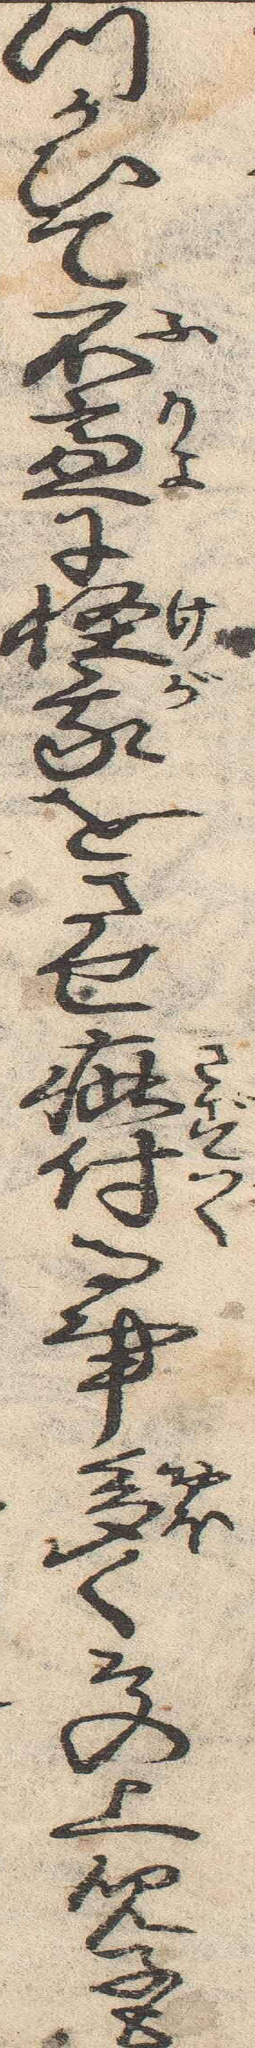つかひて不慮に怪我をさせ疵付る事多くその上児子も
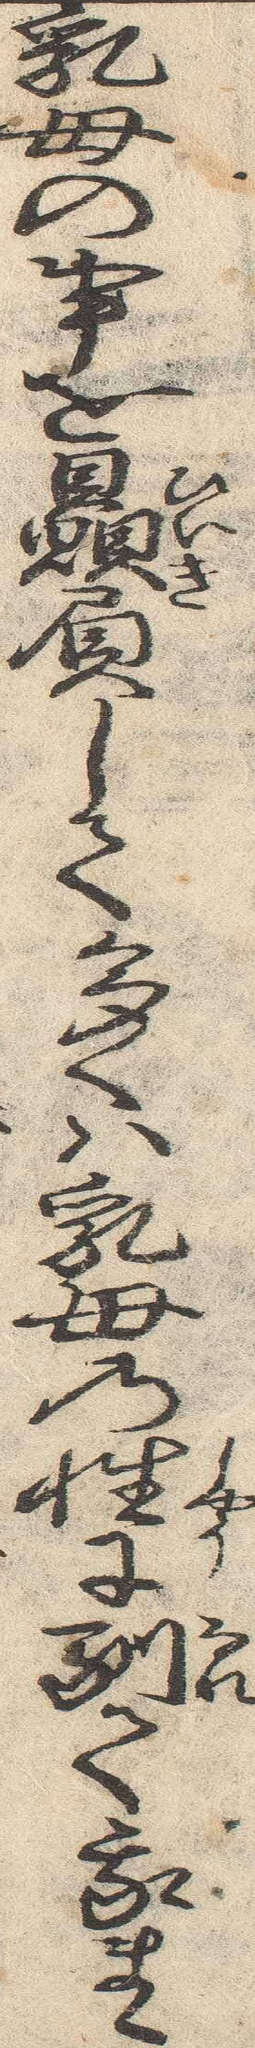乳母の事を贔屓して多くは乳母の性に馴て我まゝ
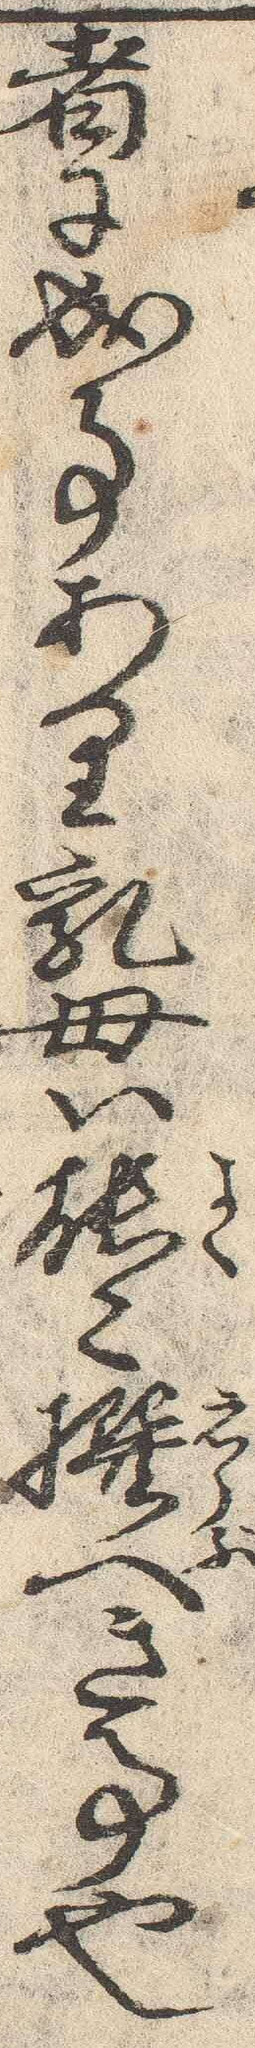者に成事あり乳母は能〻撰へき事也
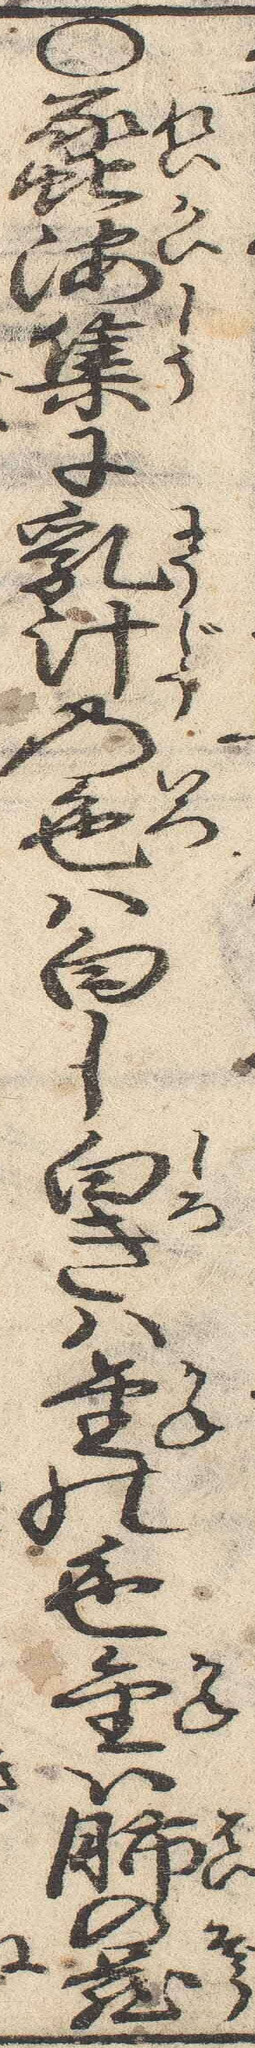◯蠡海集に乳汁の色は白し白きは金の色金は肺の蔵
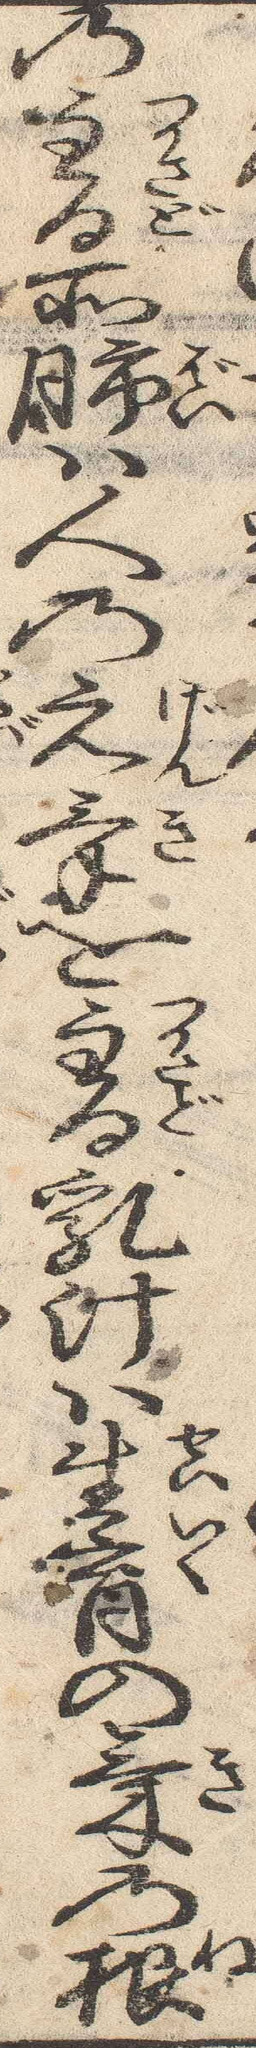の主る所肺は人の元氣を主る乳汁は生育の氣の根
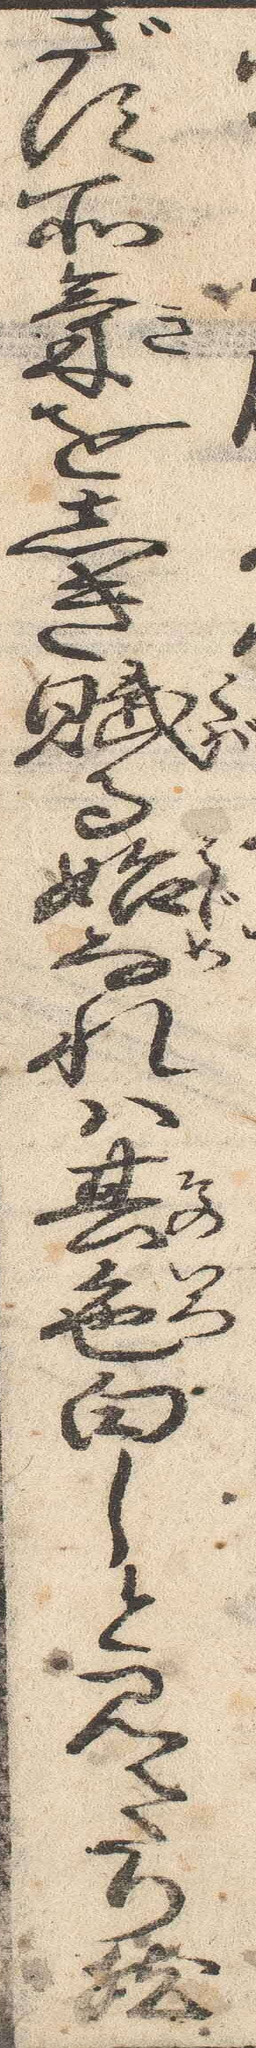ざす所氣をしき賦る始なれは其色白しと見えたり然
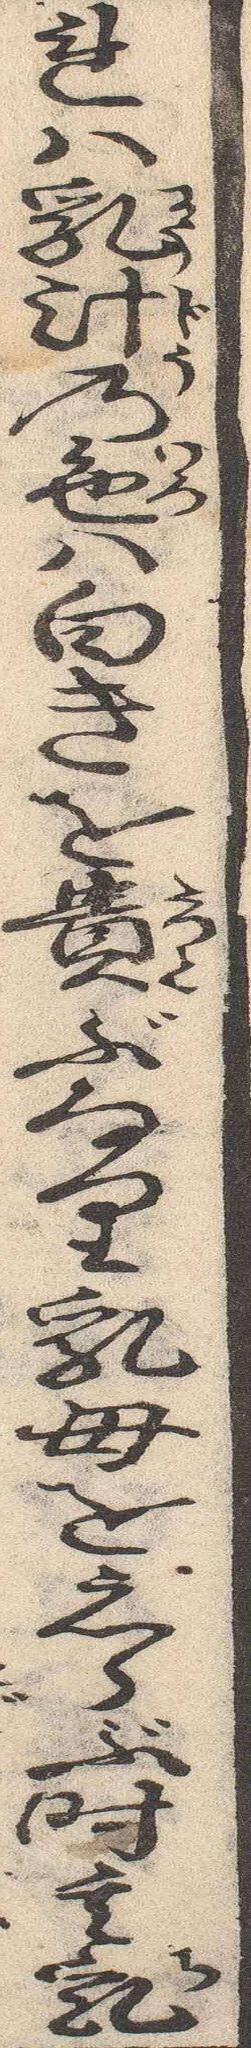れは乳汁の色は白きを貴ぶなり乳母をえらぶ時其乳
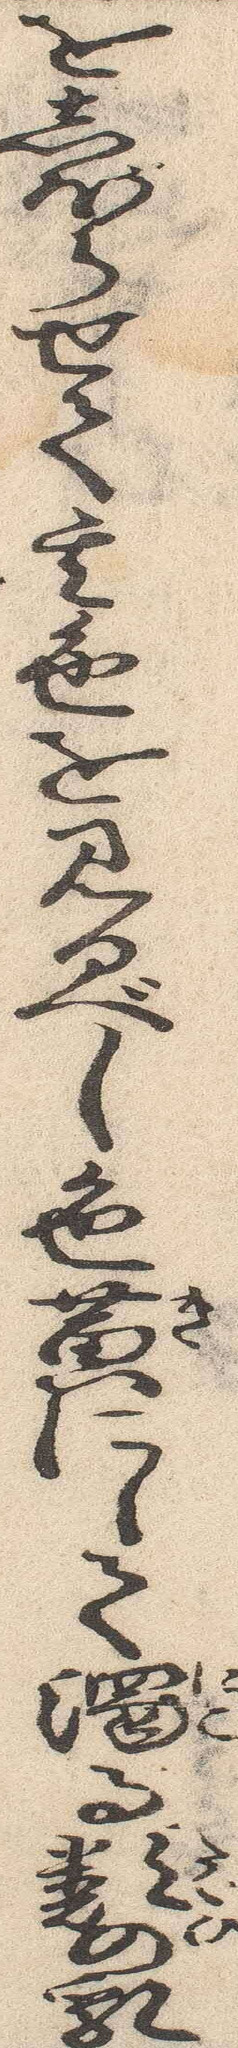をしぼらせて其色を見るべし色黄にして濁る類の乳
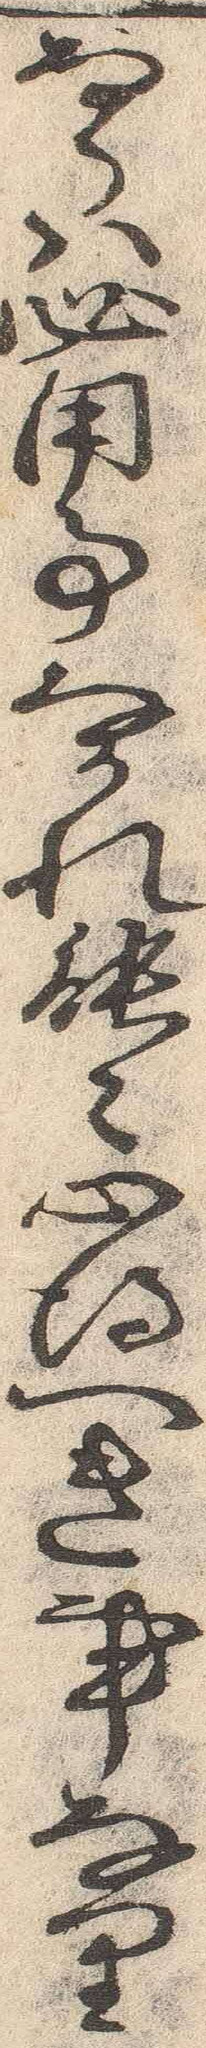ならは必用事なかれ能〻心得へき事なり
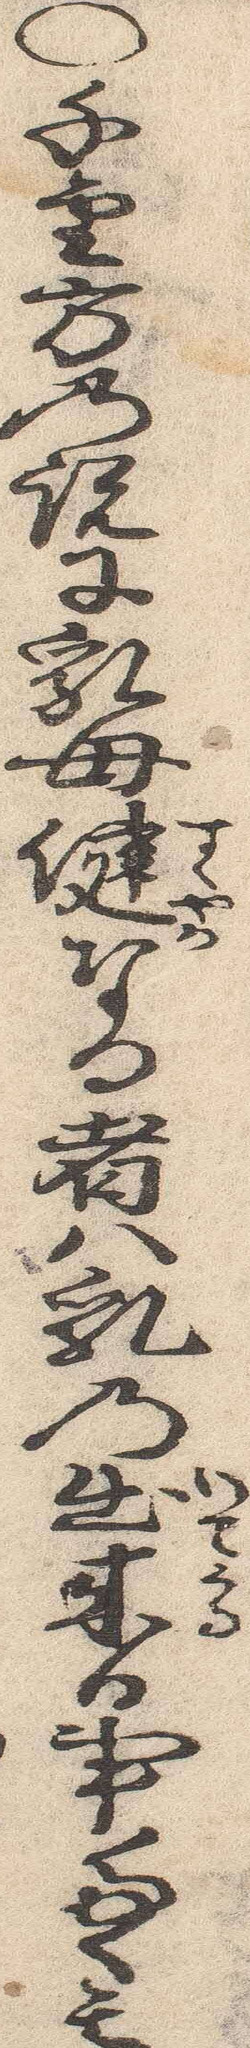◯千金方の説に乳母健なる者は乳の出来る事多く其
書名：小児必用養育草
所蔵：東京学芸大学附属図書館 国文学研究資料館
